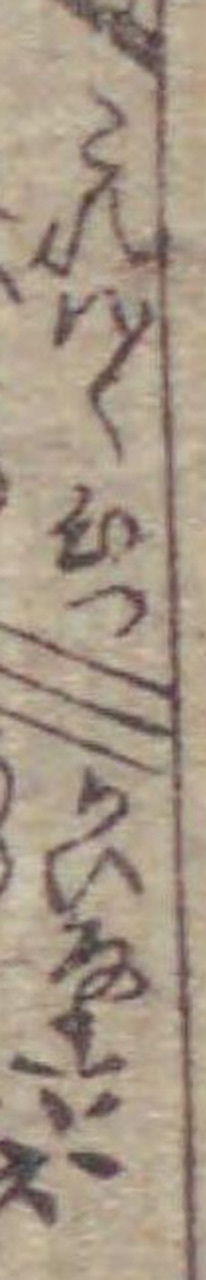これは〳〵心つかいな
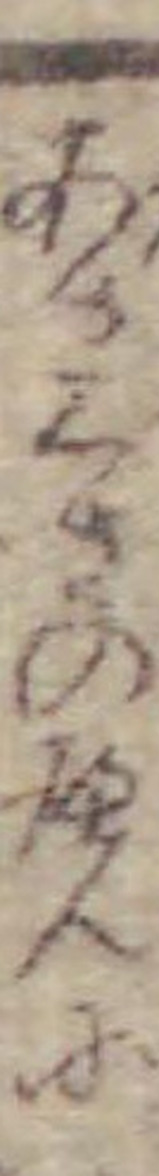あさくさの願人に
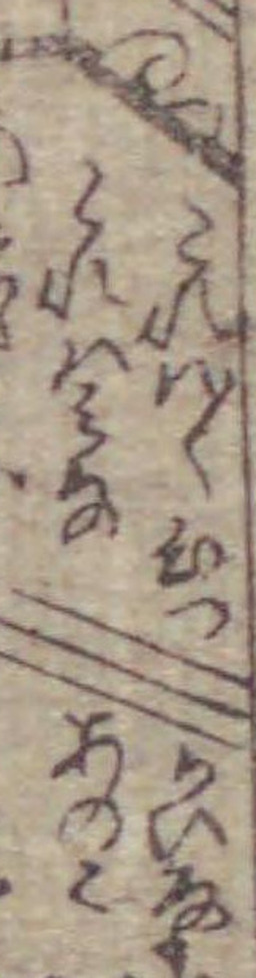これはみなあのこ
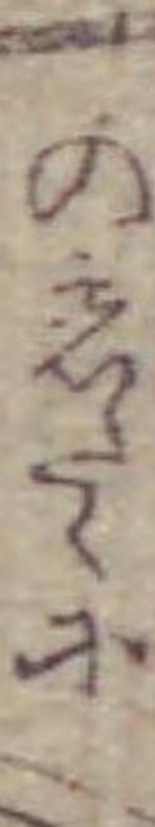のしたくに
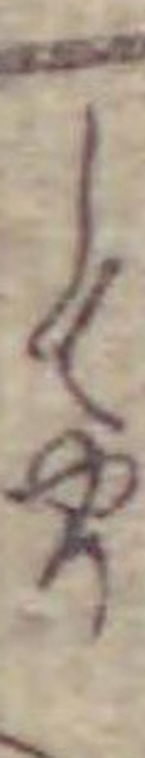してやり
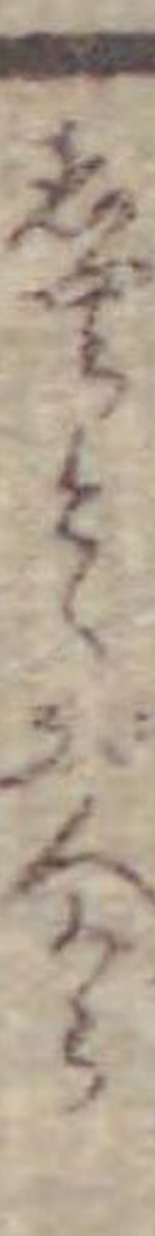しやらとくぶ人から
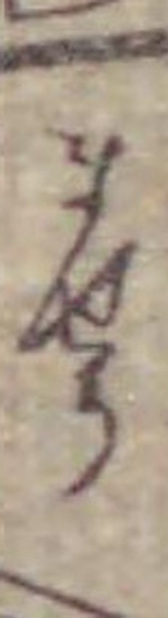ませう
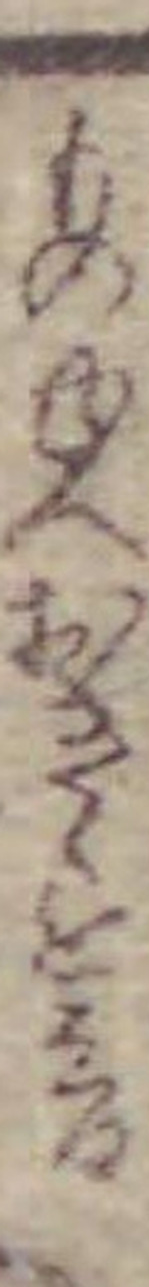ものゆへおきくをみる
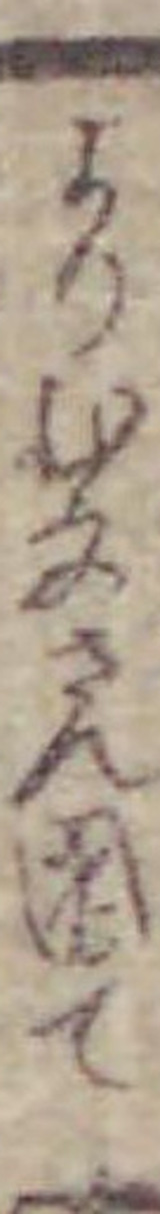よりむなさん用て
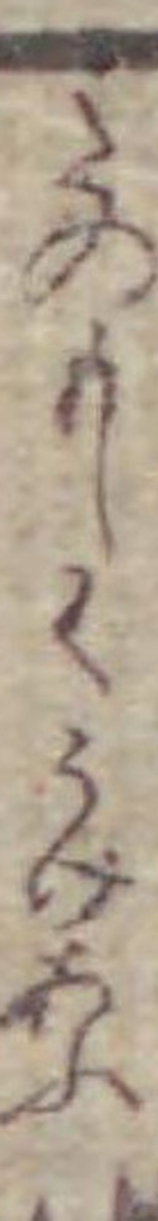たのもしくうけあふ
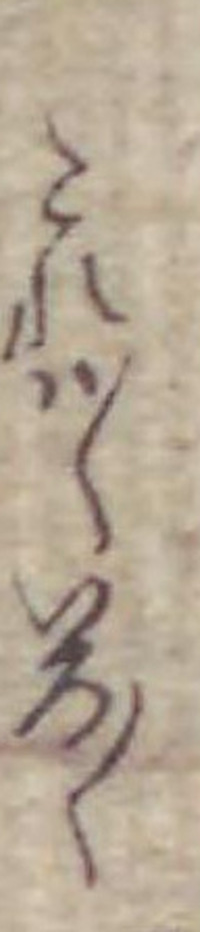これは〳〵いろ〳〵
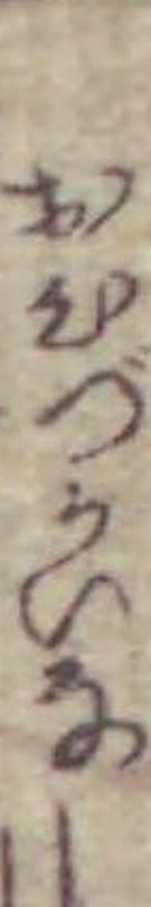お心づかいな
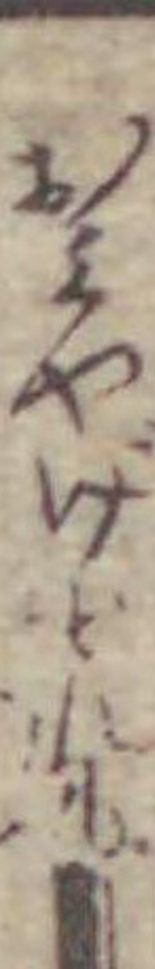おみやげどれも
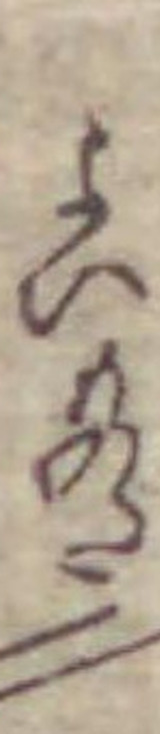よいものだ
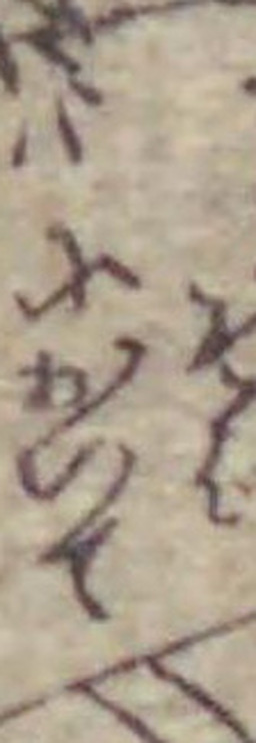において
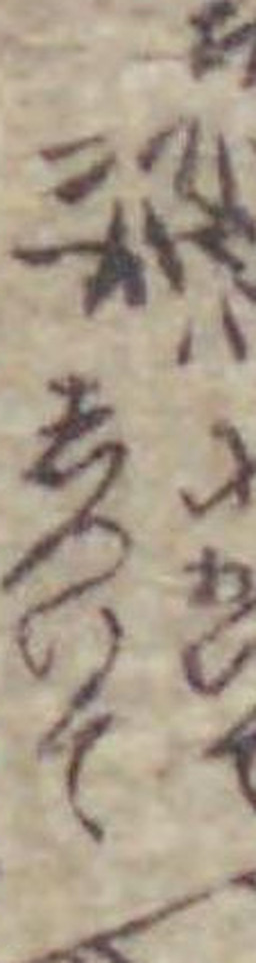しついて
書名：嗚呼不侭世之助噺 : 3巻
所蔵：国立国会図書館 National Diet Library, JAPAN
